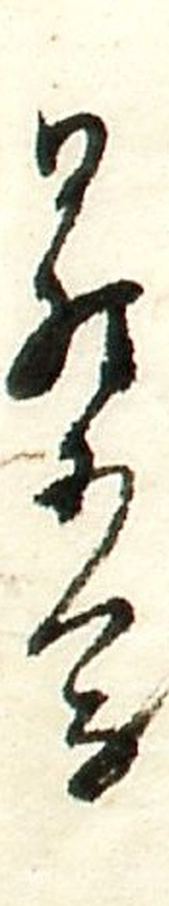同村五人与
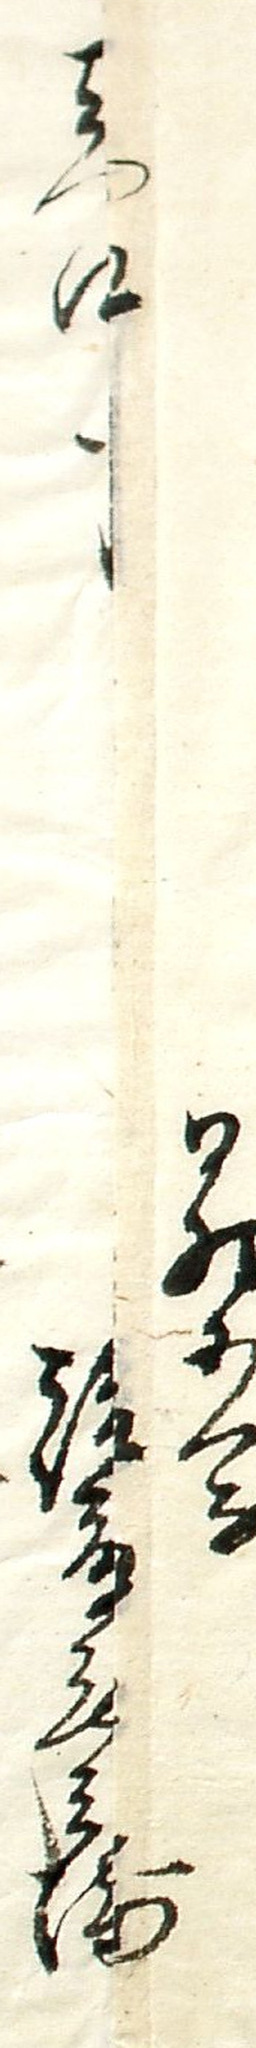亥四月後藤庄兵衛
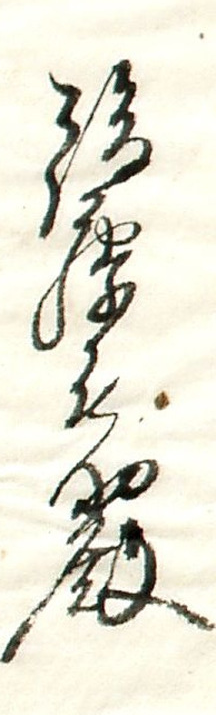後藤庄助殿

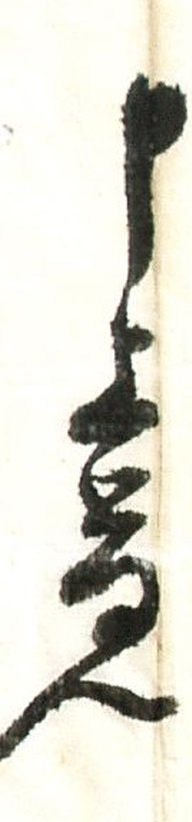申上覚
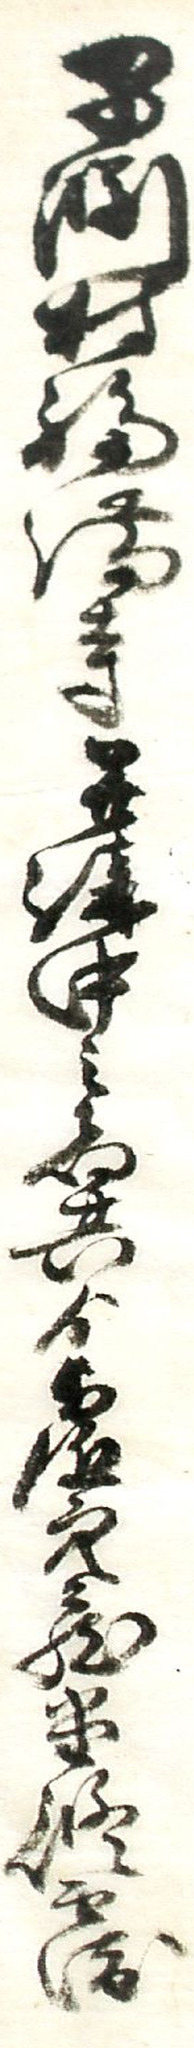早渕村福満寺幷講中之者共ゟ虚空蔵堂修覆
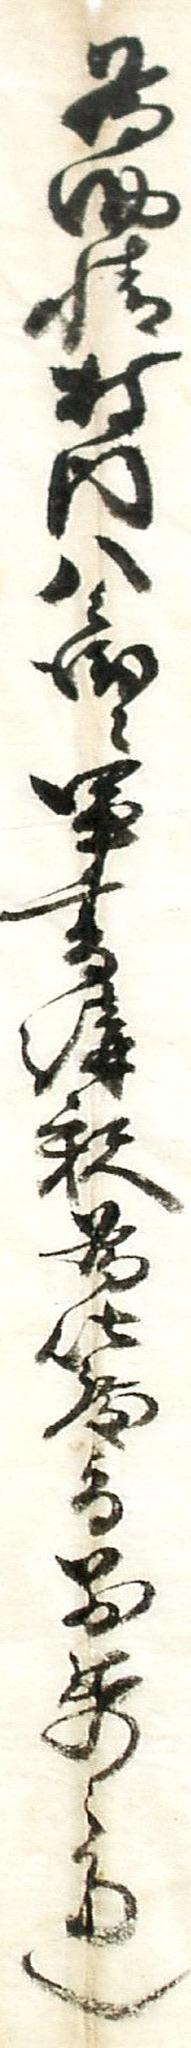為助情村内八兵衛ニ軍書講釈為仕度旨別帋之通
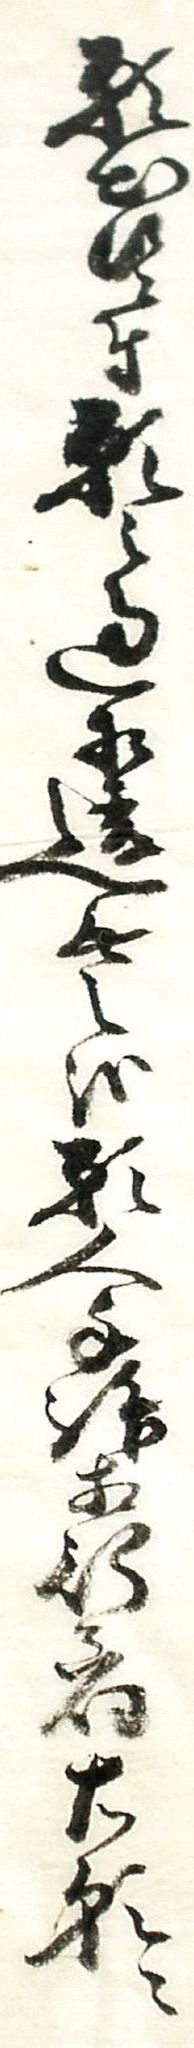願出候ニ付願之通相違無之哉願人手許相行着右願ニ
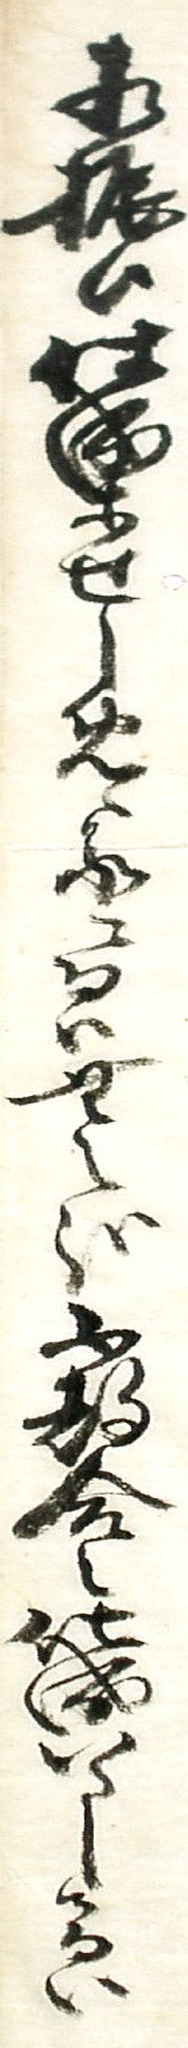相振候仕成等せしめ候義ニ而ハ無之哉不都合之仕成いたし候而ハ
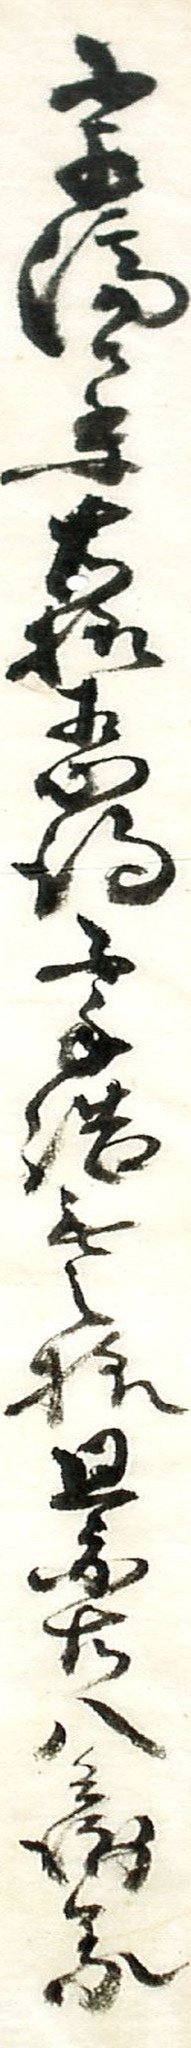不相済候条右様相心得不手詰無之様且亦八兵衛義
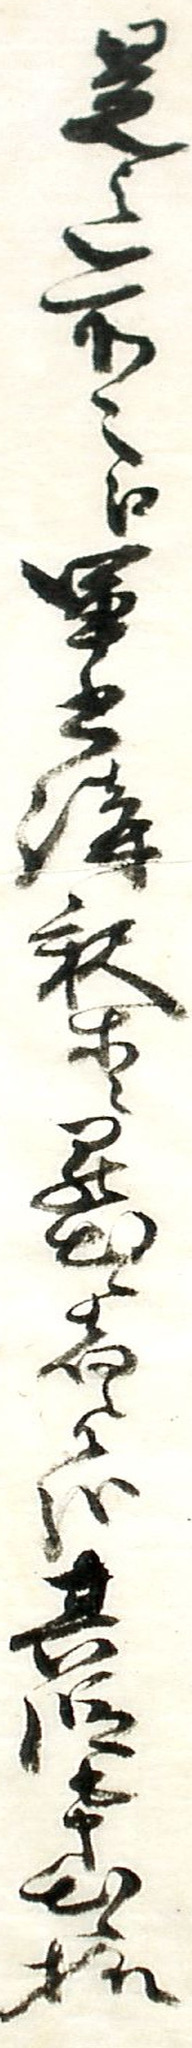是迄所々江軍書講釈等ニ罷出候者ニ候哉其段も申出候様
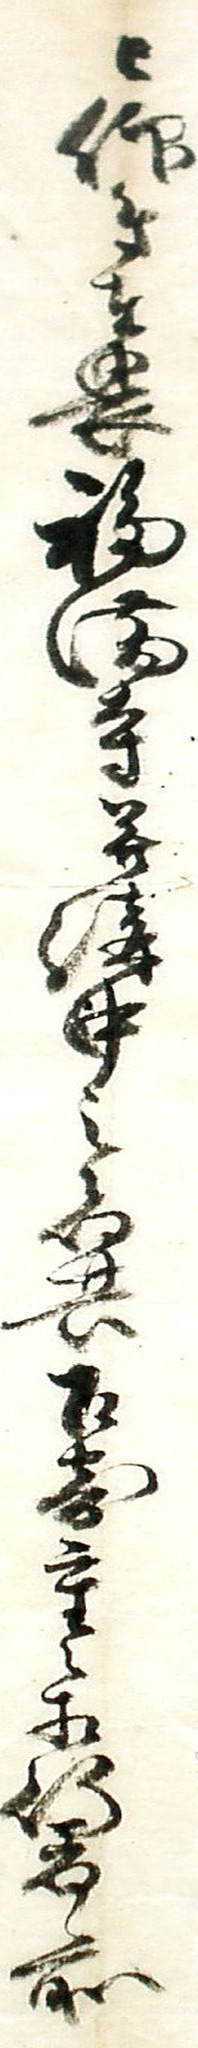被仰付奉畏福満寺幷講中之者共召寄重々相行着候所
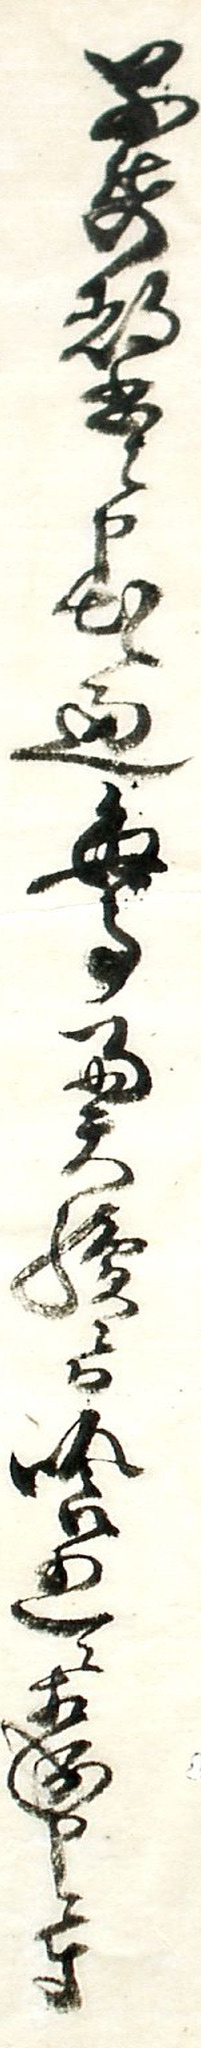別帋都書ニ申出候通毎事雨天續ニ而喰込ニ相成申ニ付
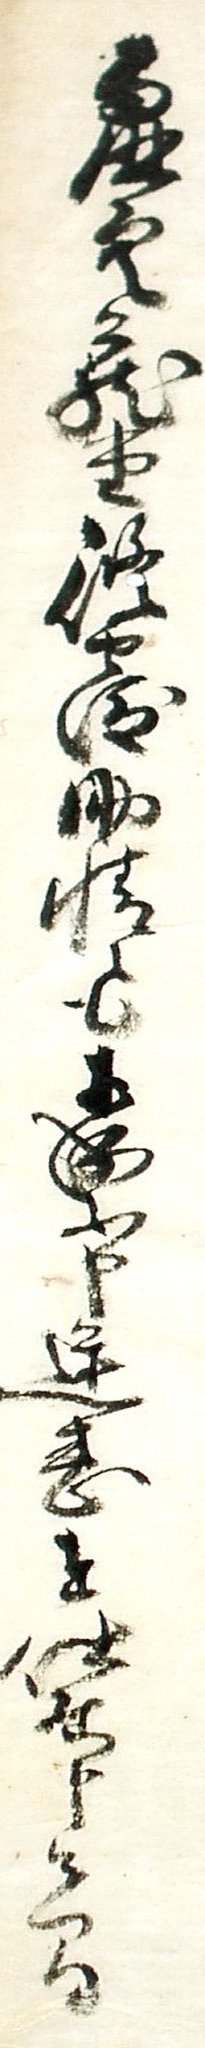虚空蔵堂修覆助情ニも相成不申迷惑を仕居申候間
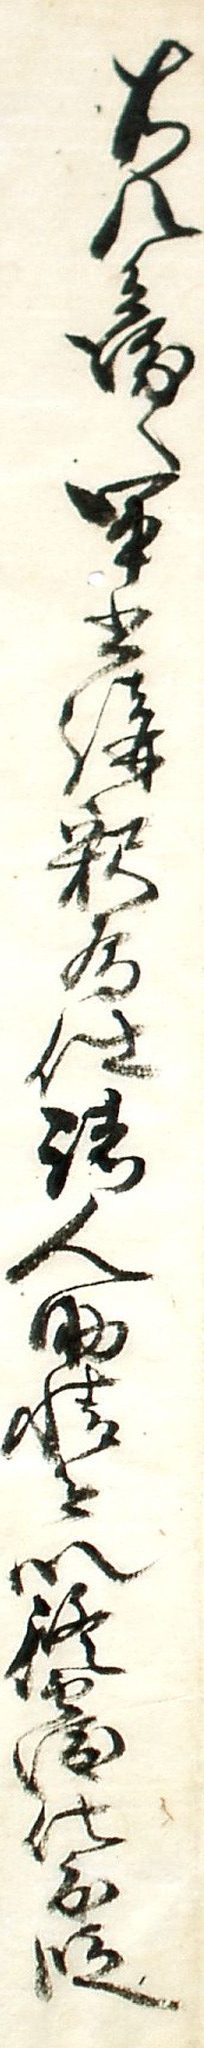右八兵衛へ軍書講釈為仕諸人助情を以修覆仕度段
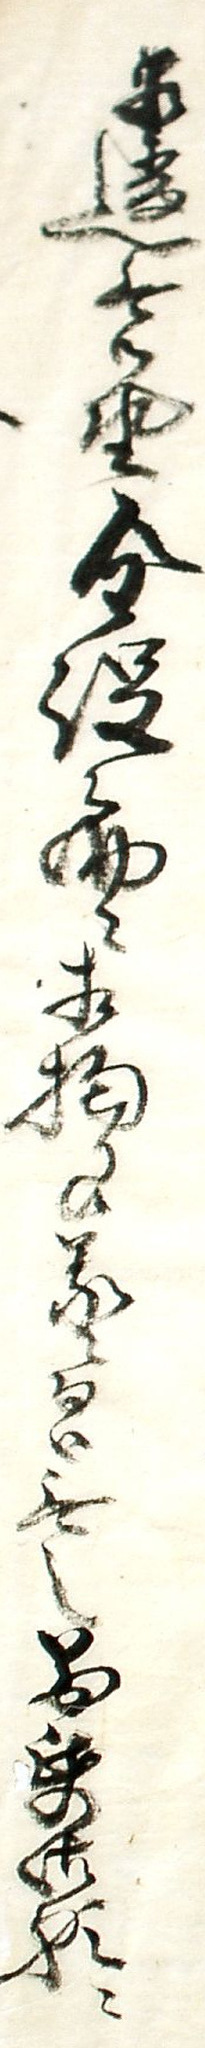相違無御坐全役筋ニ相拘り候義ニ而ハ無之別帋御願ニ
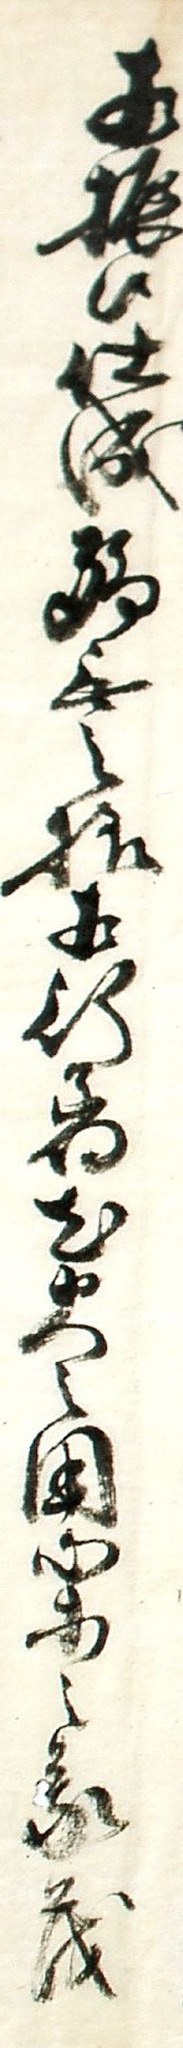相振候仕成聊無之様相行着尤火之用心等之義も
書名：（早渕村福満寺虚空蔵菩薩堂修復のためおどけ軍書講談願行着添え書控）
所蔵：鳴門教育大学 Naruto University of Education
